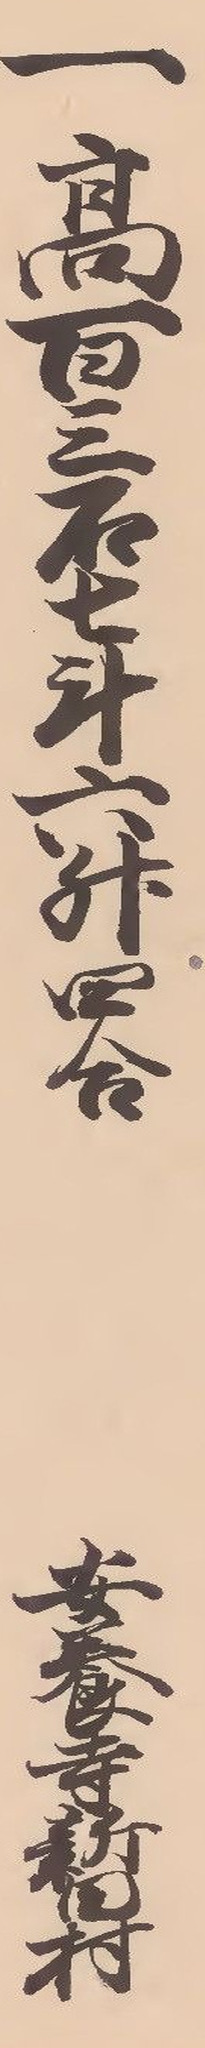一高百三石七斗六升四合安養寺新田村
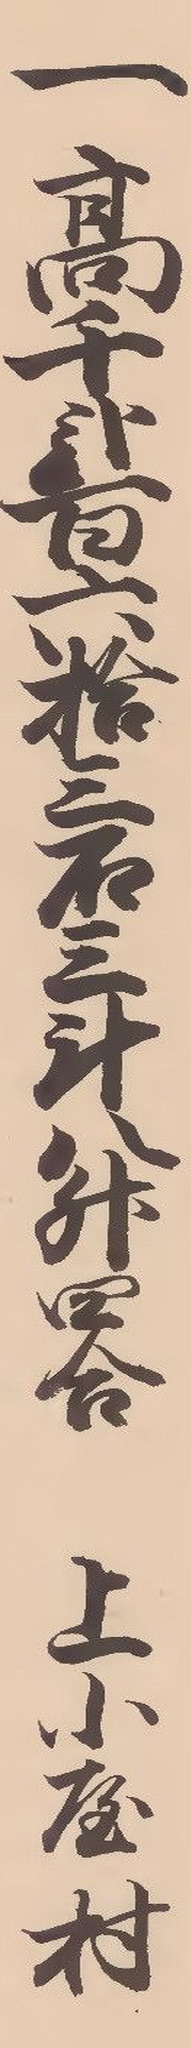一高千弐百六拾三石三斗八升四合上小屋村
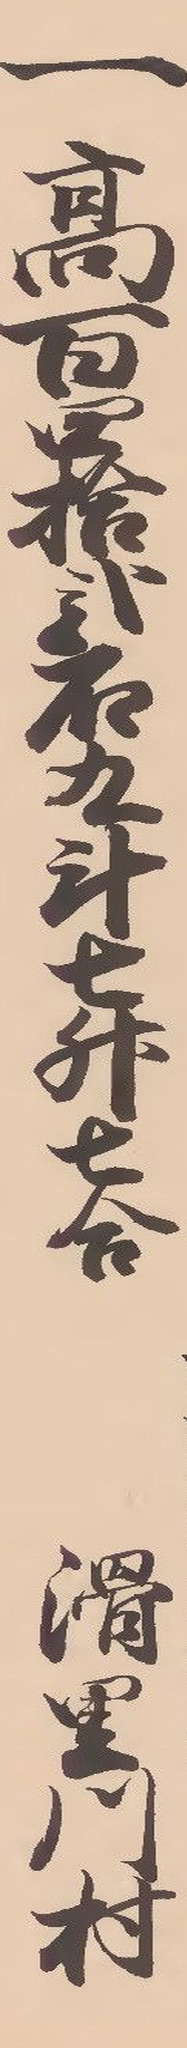一高百四拾弐石九斗七升七合滑里川村
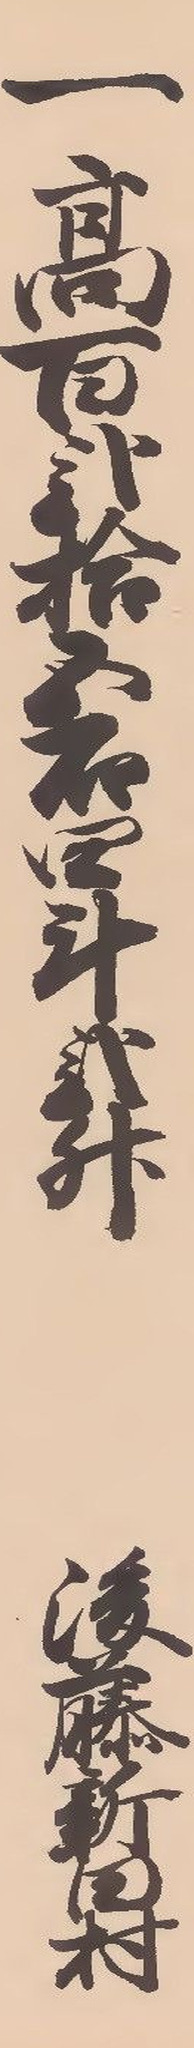一高百弐拾五石四斗弐升後藤新田村
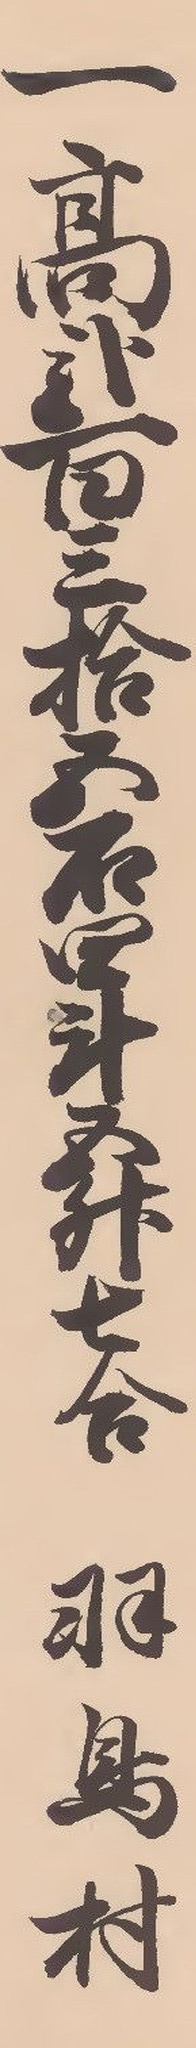一高弐百三拾五石四斗五升七合羽鳥村
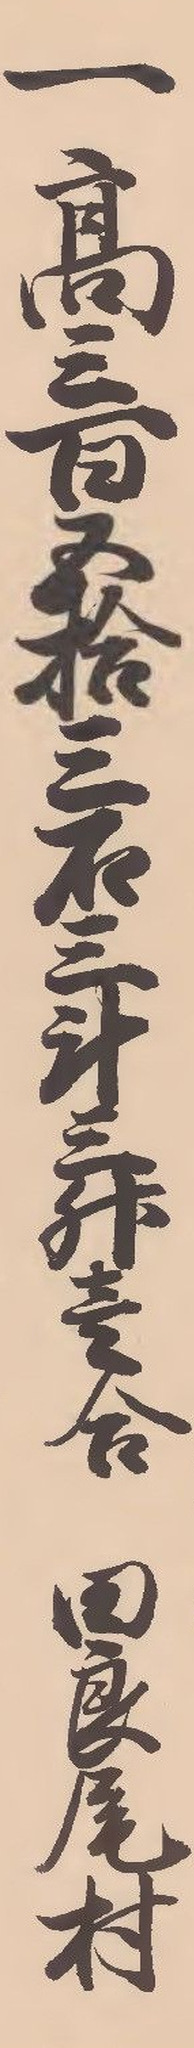一高三百五拾三石三斗三升壱合田良尾村
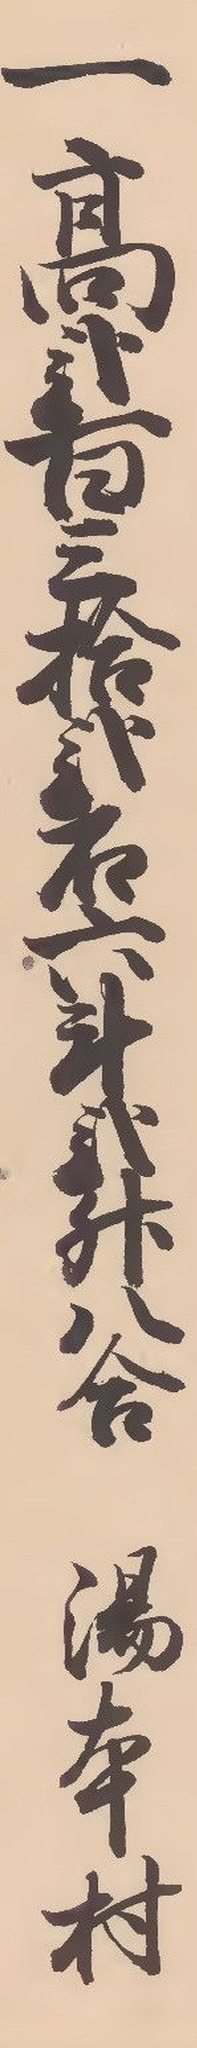一高弐百三拾弐石六斗弐升八合湯本村

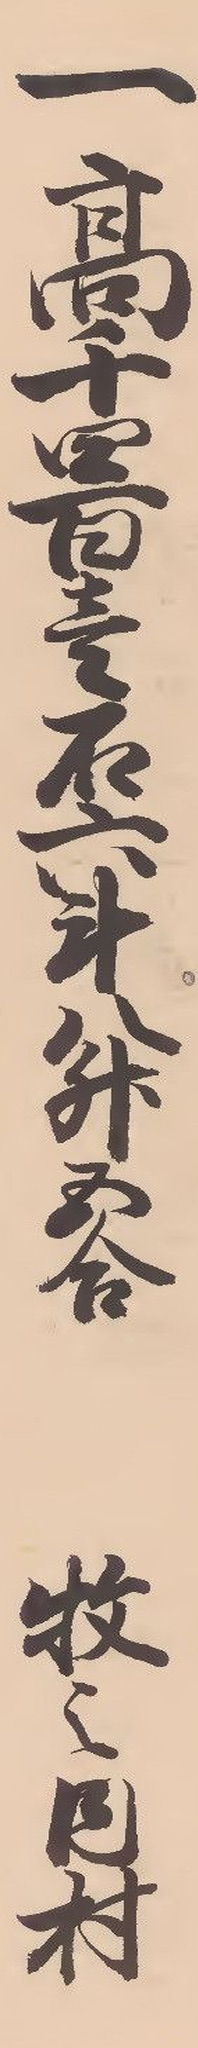一高千四百壱石六斗八升五合枚之内村
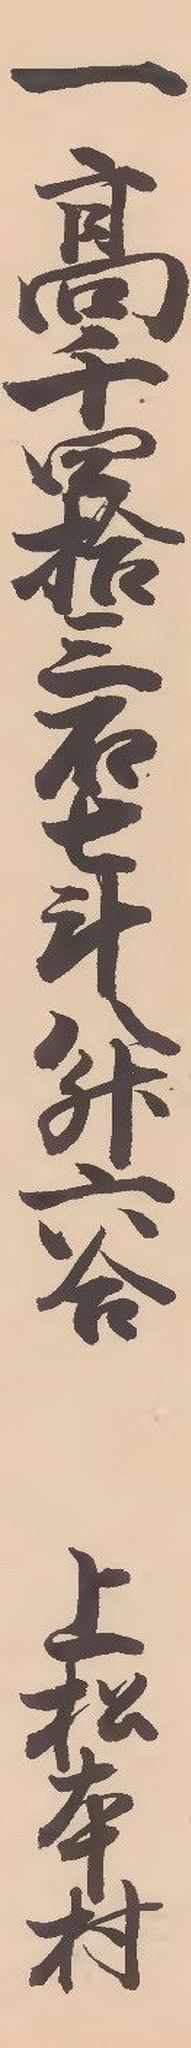一高千四拾三石七斗八升六合上松本村
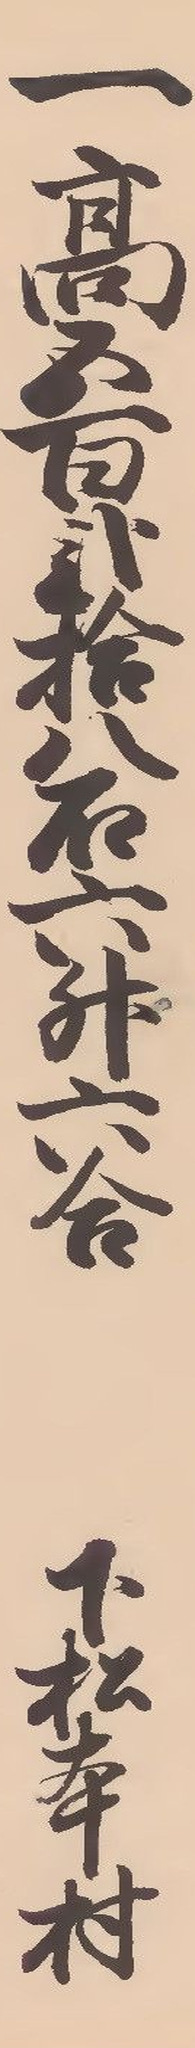一高五百弐拾八石六升六合下松本村
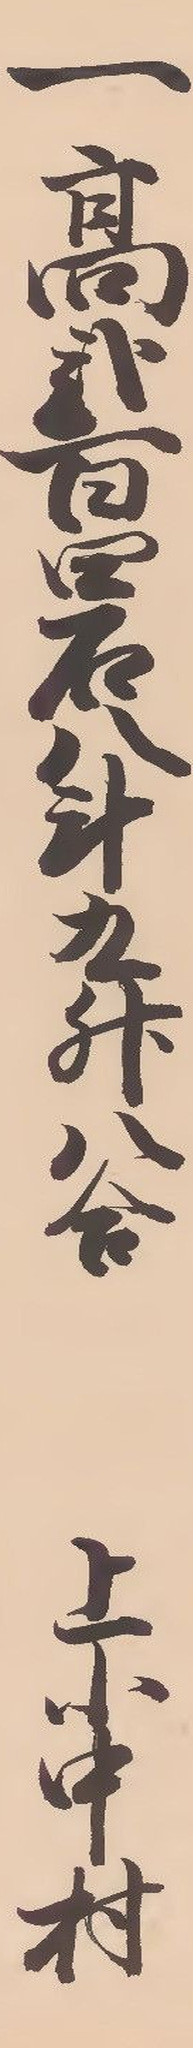一高弐百四石八斗九升八合上小中村
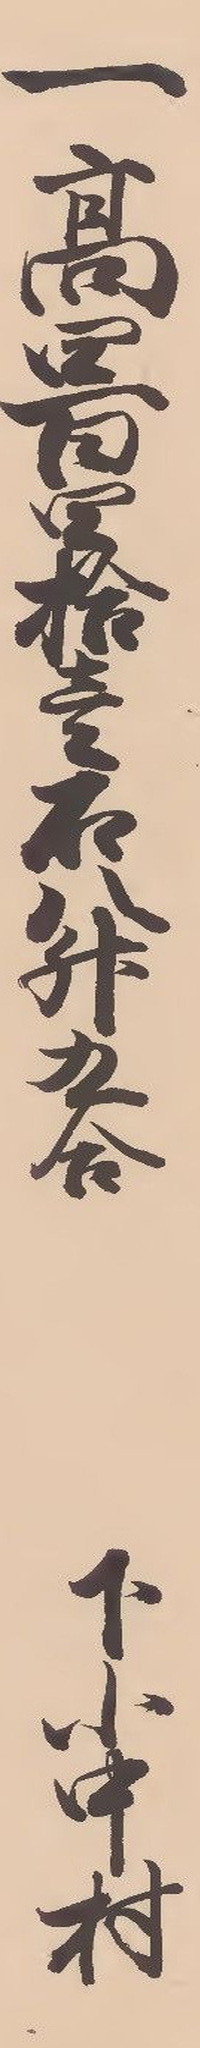一高四百四拾壱石八升九合下小中村
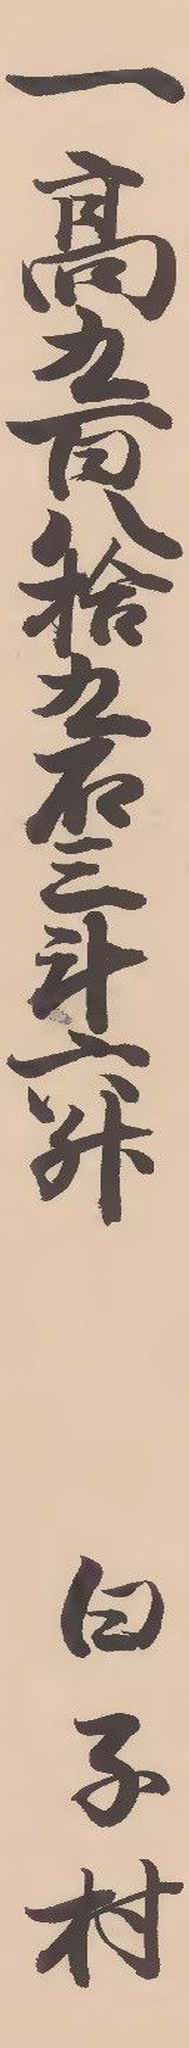一高九百八拾九石三斗六升白子村
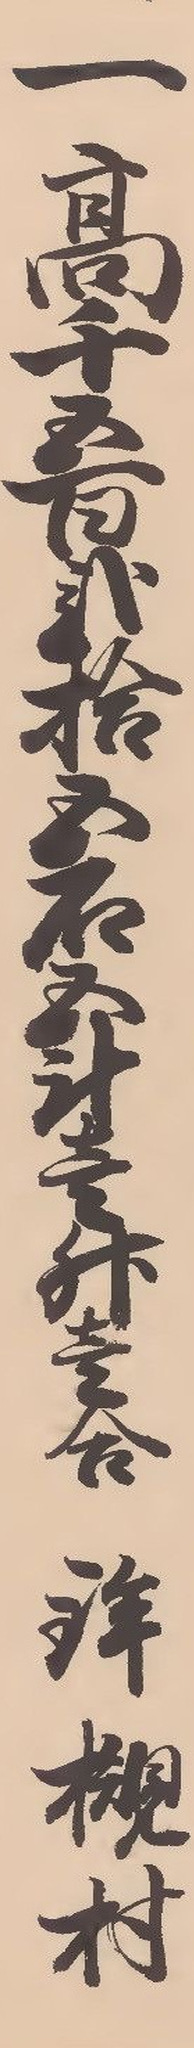一高千五百弐拾五石五斗壱升壱合鉾槻村
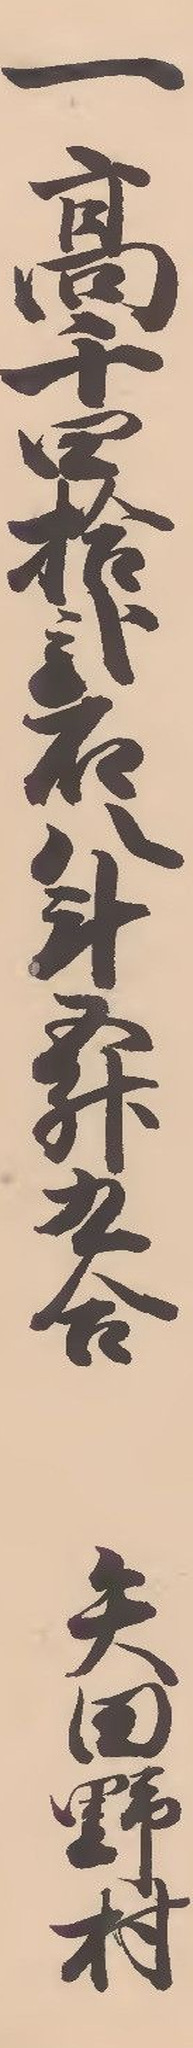一高千四拾弐石八斗五升九合矢田野村

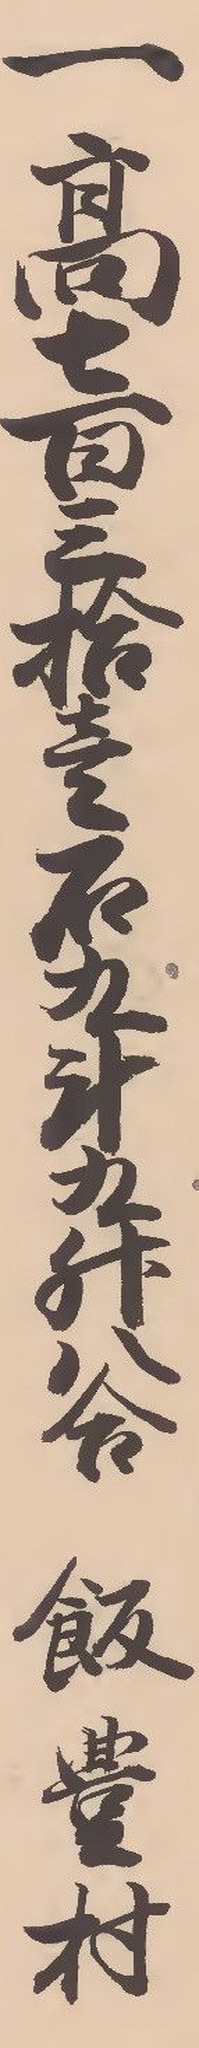一高七百三拾壱石九斗九升八合飯豊村
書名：陸奥国郷帳　２
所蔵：国立公文書館 National Archives of Japan
